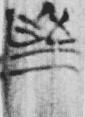爲
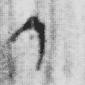人
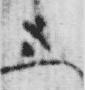之
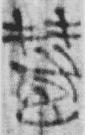慧（快）
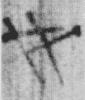女（如）
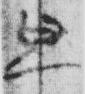也
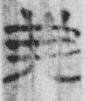弗
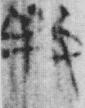牧
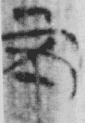不
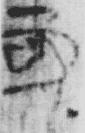可
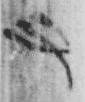又
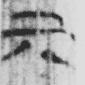亓
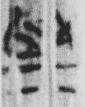爲
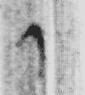人
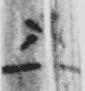之
